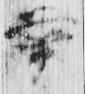辛
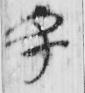丑
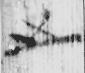之
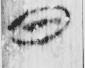日
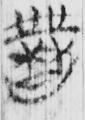○（許）
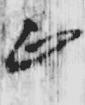㠯（以）
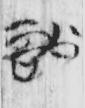訟
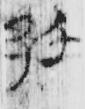邸
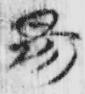昜（陽）
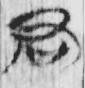君
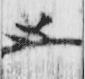之
